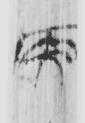侯
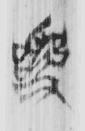亂
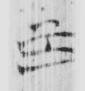正
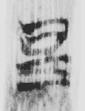是
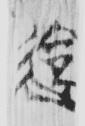御
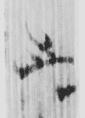之
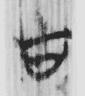古
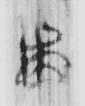求
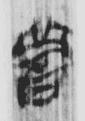善
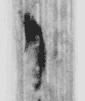人
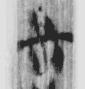必
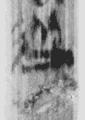從
